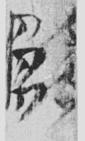降
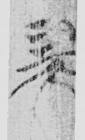耑（端）
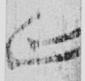㠯（以）
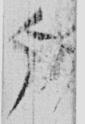比
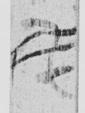民
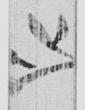之
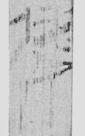播
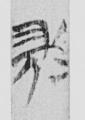{𡵂攴}（美）
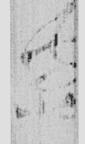弃
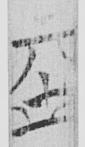亞（惡）
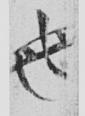母
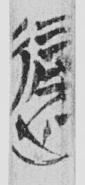○（侵）
